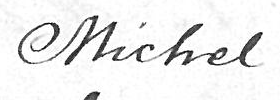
Michel
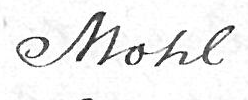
Mohl
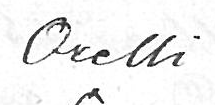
Orelli
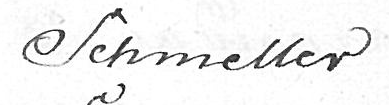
Schmeller
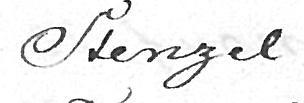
Stenzel
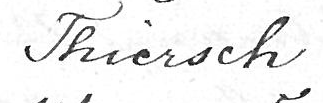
Thiersch
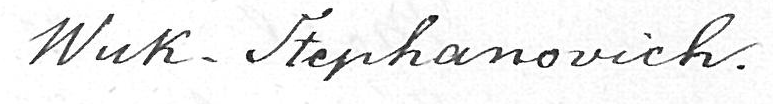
Wuk-Stephanovich.
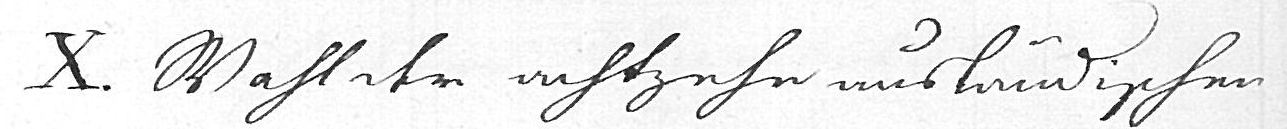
X. Wahl der achtzehn ausländischen
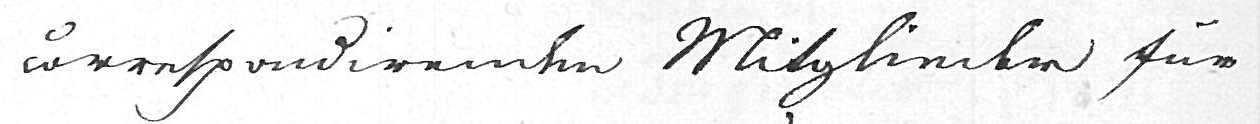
correspondirenden Mitglieder für
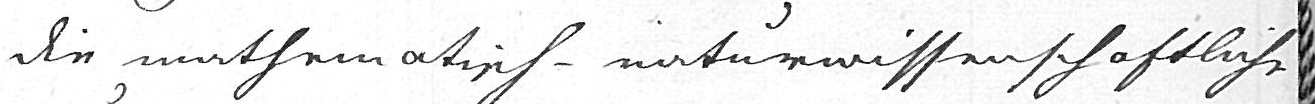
die mathematisch-naturwissenschaftliche
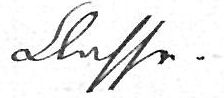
Classe.
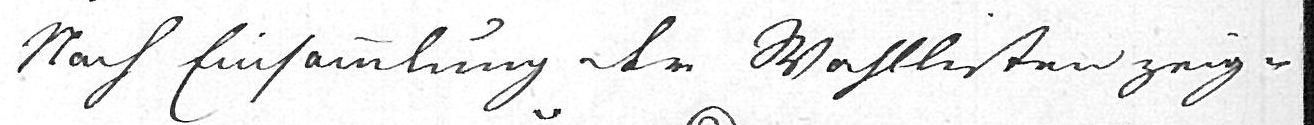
Nach Einsammlung der Wahllisten zeig-
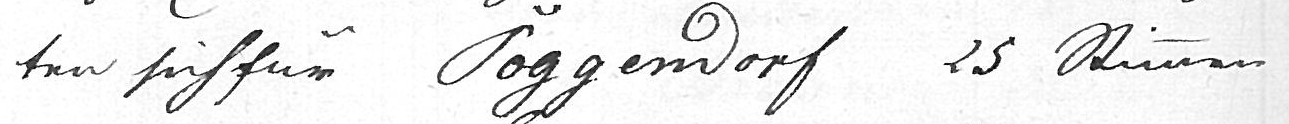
ten sich für Poggendorf 25 Stimmen
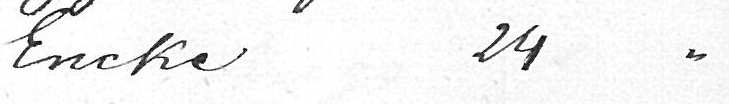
Encke 24 "
